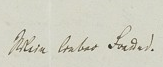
Mein lieber Freund.
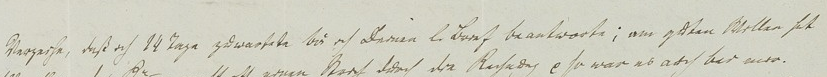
Verzeihe, daß ich 14 Tage zuwartete bis ich Deinen l. Brief beantworte; am guten Willen hat
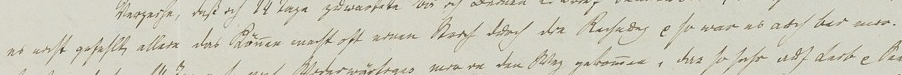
es nicht gefehlt, allein das Können macht oft einen Strich durch die Rechnung & so war es auch bei mir.
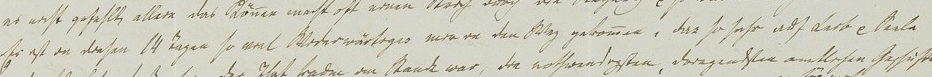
Es ist in diesen 14 Tagen so viel Widerwärtiges mir in den Weg gekommen, das so sehr auf Leib & Seele
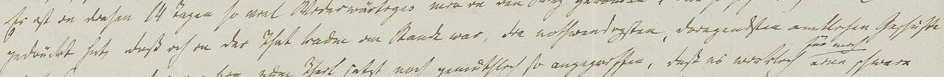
gedrückt hat, daß ich in der That kaum im Stande war, die nothwendigsten, dringendsten amtlichen Geschäfte
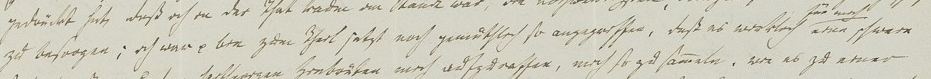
zu besorgen; ich war & bin zum Theil jetzt noch gemüthlich so angegriffen, daß es wirklich für mich eine schwere
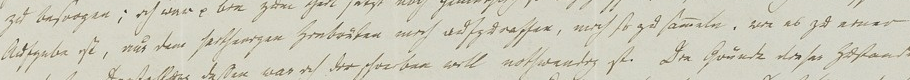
Aufgabe ist, aus dem seitherigen Hinbrüten mich aufzuraffen, mich so zu sammeln, wie es zu einer
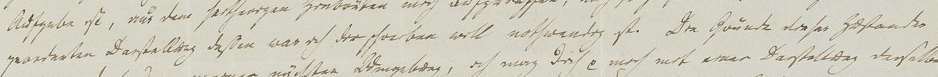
geordneten Darstellung dessen was ich Dir schreiben will nothwendig ist. Die Gründe dieses Zustandes
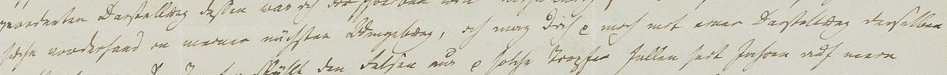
suche vorderhand in meiner nächsten Umgebung, ich mag Dich & mich mit einer Darstellung derselben
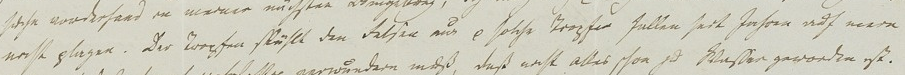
nicht plagen. Der Tropfen spühlt den Felsen aus & solche Tropfen fallen seit Jahren auf mein
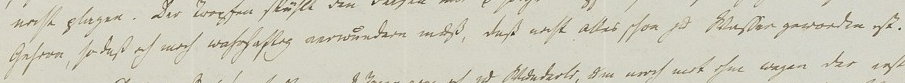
Gehirn, so daß ich mich wahrhaftig verwundern muß, daß nicht alles schon zu Wasser geworden ist.
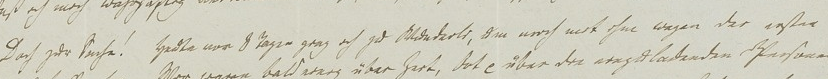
Doch zur Sache! Heute vor 8 Tagen ging ich zu Wunderli, um mich mit ihm wegen der ersten
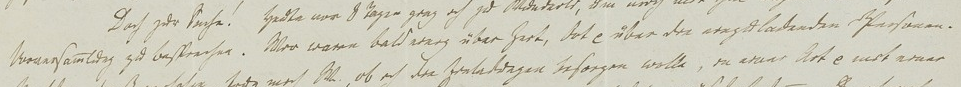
Vorversammlung zu besprechen. Wir waren bald einig über Zeit, Ort & über die einzuladenden Personen.
